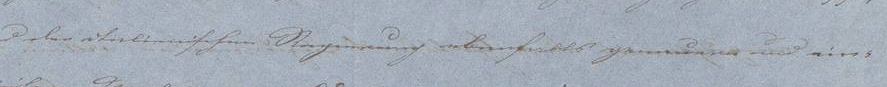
so sind der italienischen Regierung ebenfalls genauere und ein-
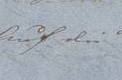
Auf die
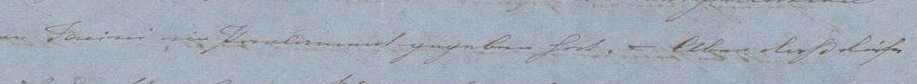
von Jacini im Parlament gegeben hat. – Aber daß diese
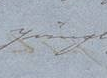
gänglich
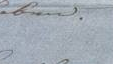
verschoben
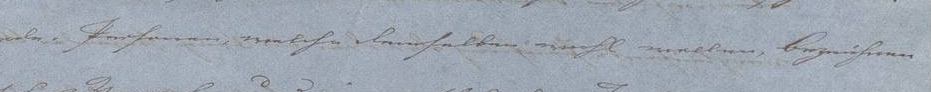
werde. Personen, welche demselben wohl wollen, bezeichnen
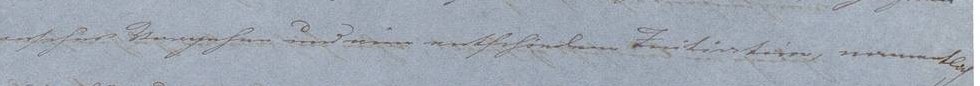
rasches Vorgehen und eine entschiedene Initiative, namentlich
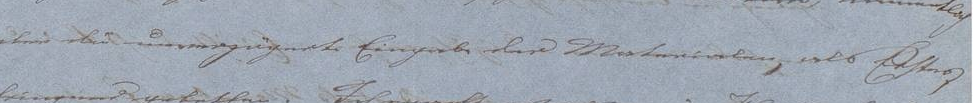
aber die unverzögerte Eingabe der Materialen, als Erstes,
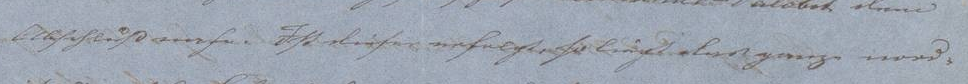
Abschluß nahe. Ist dieser erfolgt, so liegt das ganze nord-
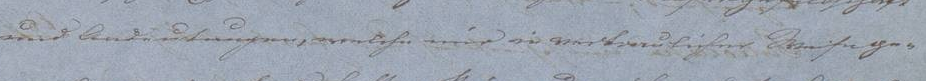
und Andeutungen, welche mir in vertraulicher Weise ge-
